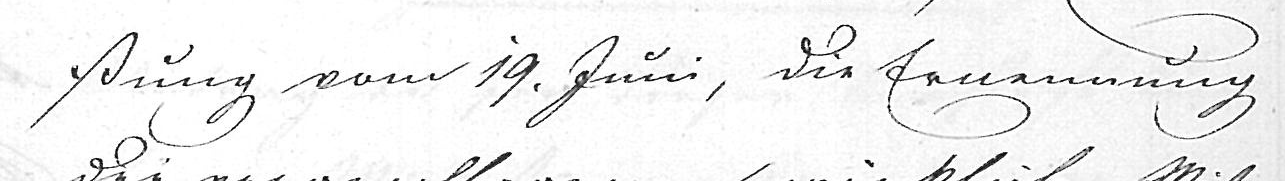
sung vom 19. Juni, die Ernennung
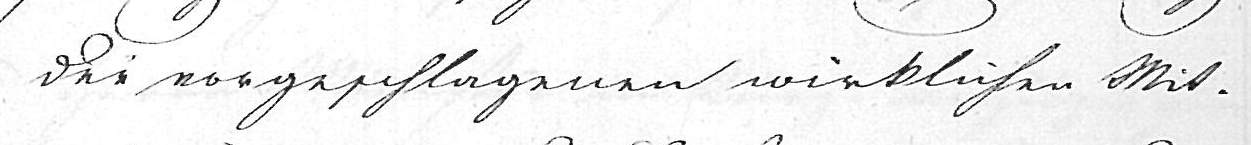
der vorgeschlagenen wirklichen Mit-
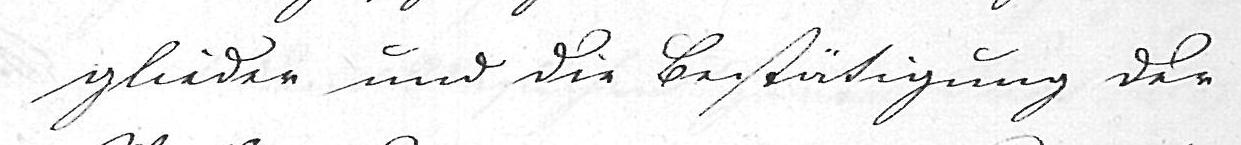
glieder und die Bestätigung der
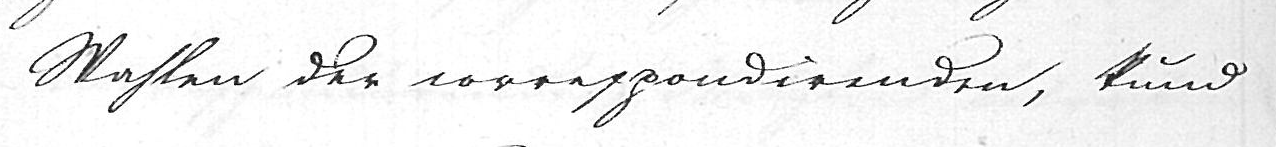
Wahlen der correspondirenden, kund
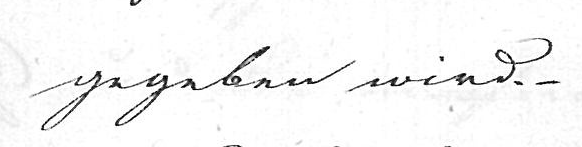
gegeben wird.
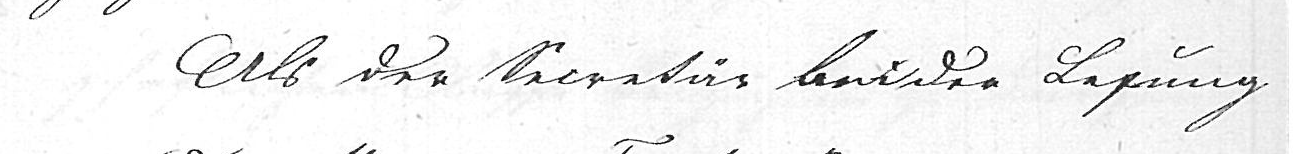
Als der Secretär bei der Lesung
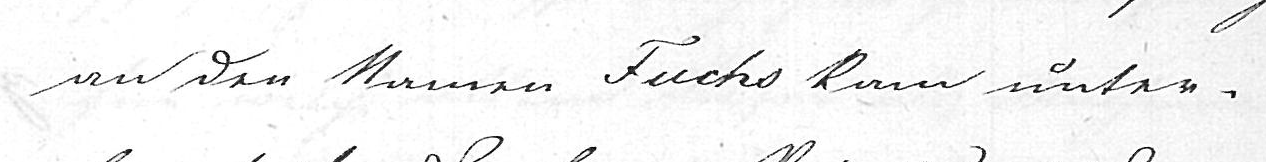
an den Namen Fuchs kam unter-
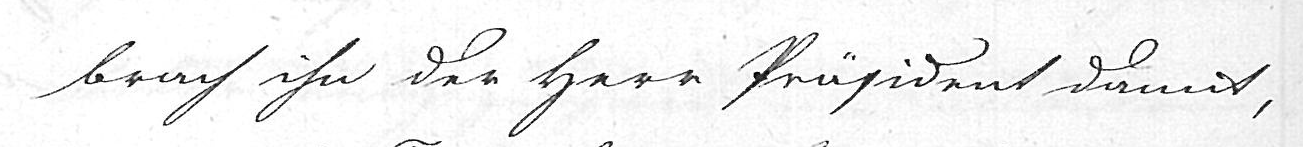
brach ihn der Herr Präsident damit,
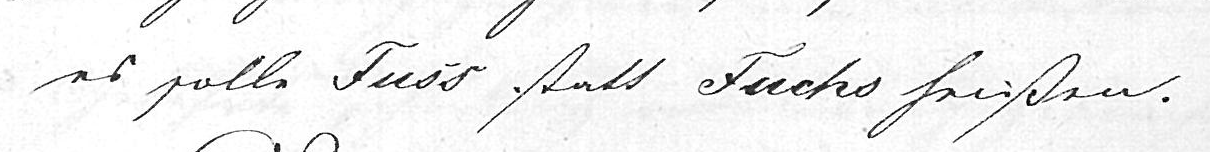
es solle Fuss statt Fuchs heißen.
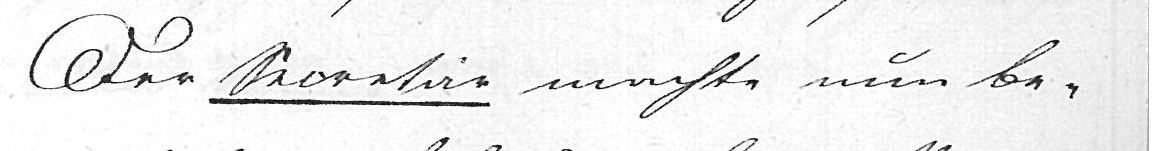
Der Secretär machte nun be-
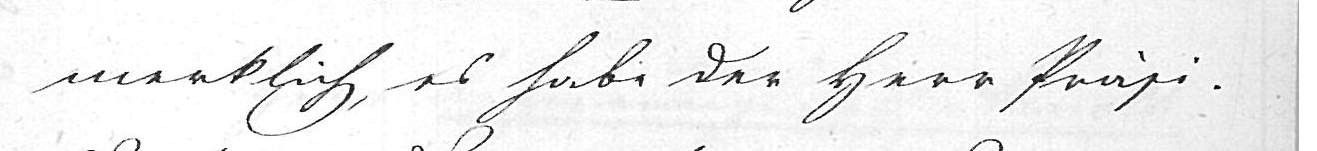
merklich, es habe der Herr Präsi-
